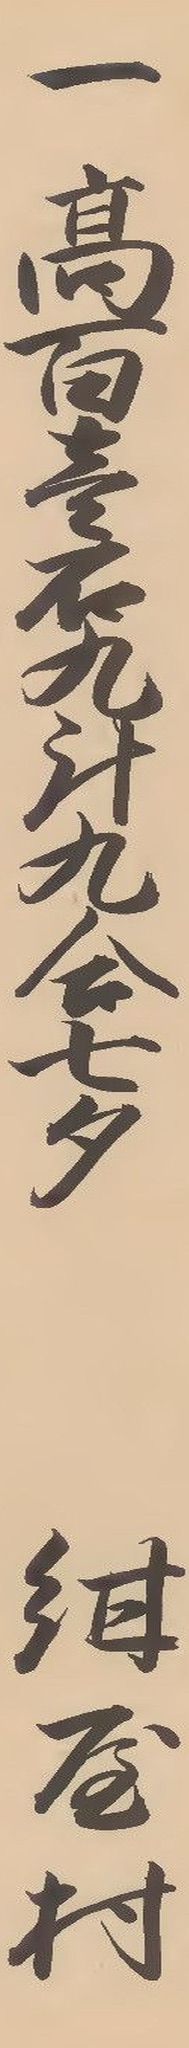一高百壱石九斗九合七勺紺屋村
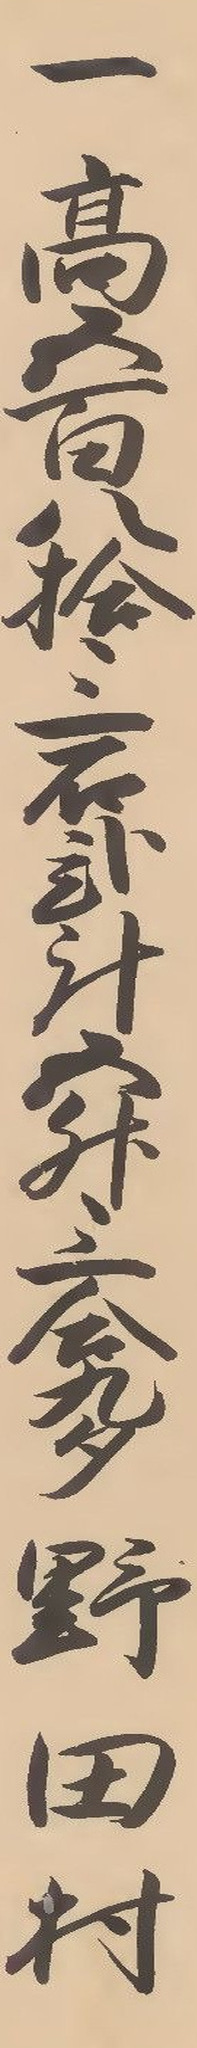一高五百八拾三石弐斗五升三合九勺野田村
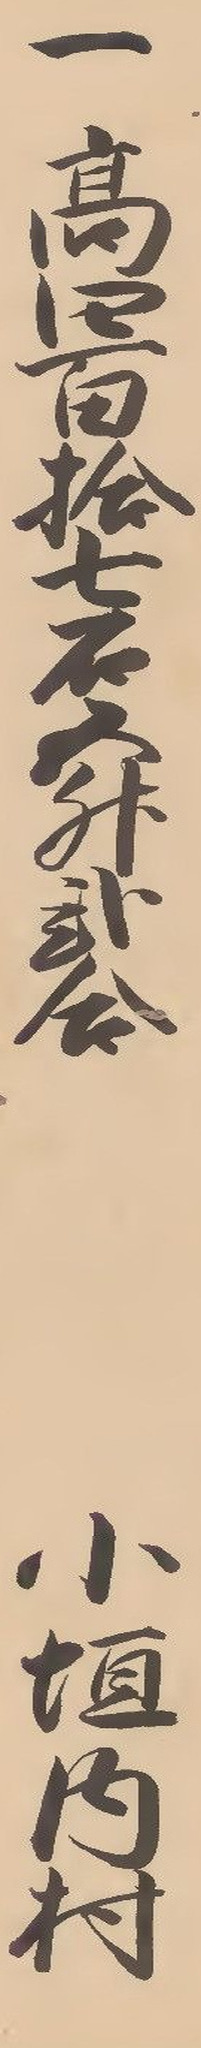一高四百拾七石五升弐合小垣内村

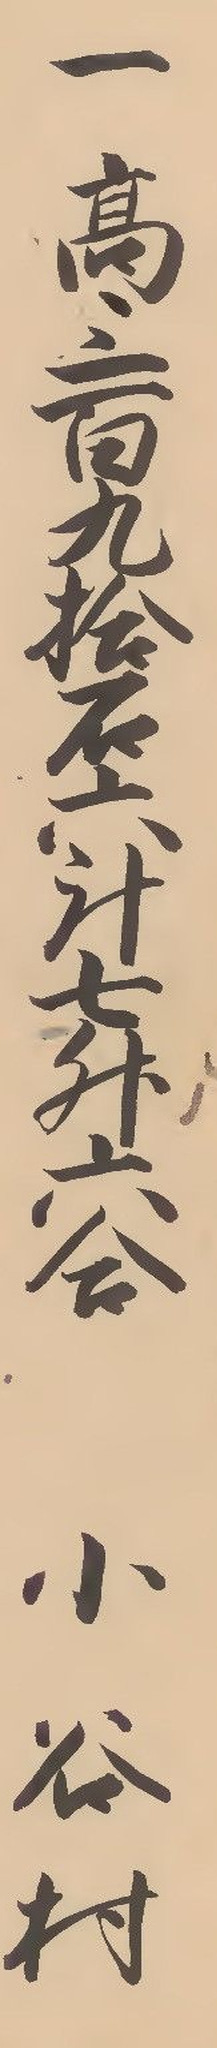一高三百九拾石六斗七升六合小谷村
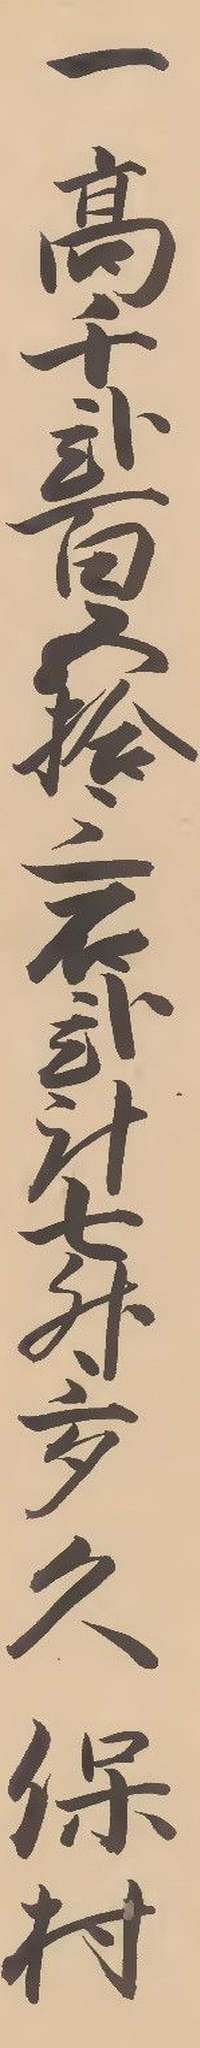一高千弐百五拾三石弐斗七升三勺久保村
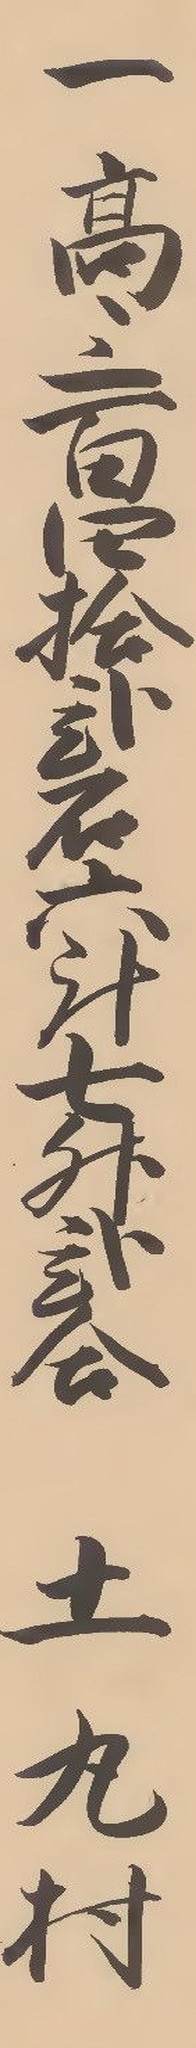一高三百四拾弐石六斗七升弐合土丸村
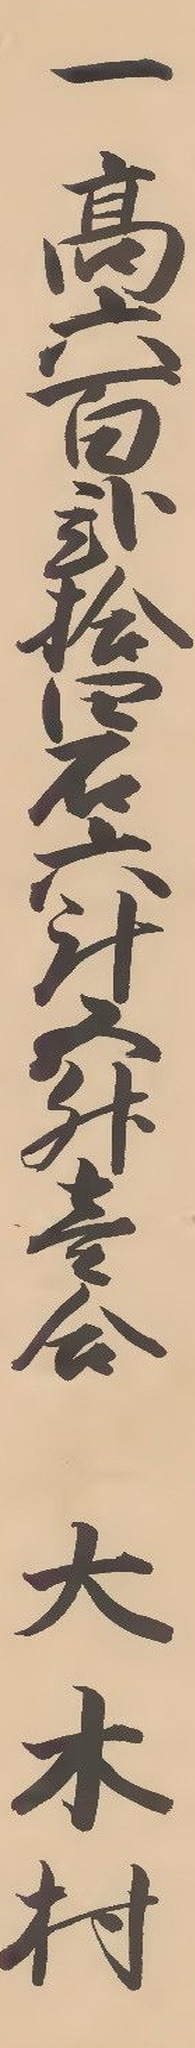一高六百弐拾四石六斗五升壱合大木村
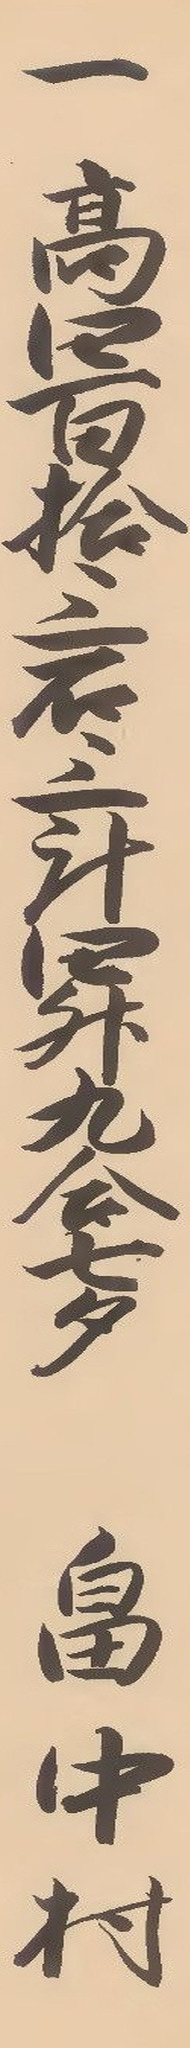一高四百拾三石三斗四升九合七勺畠中村
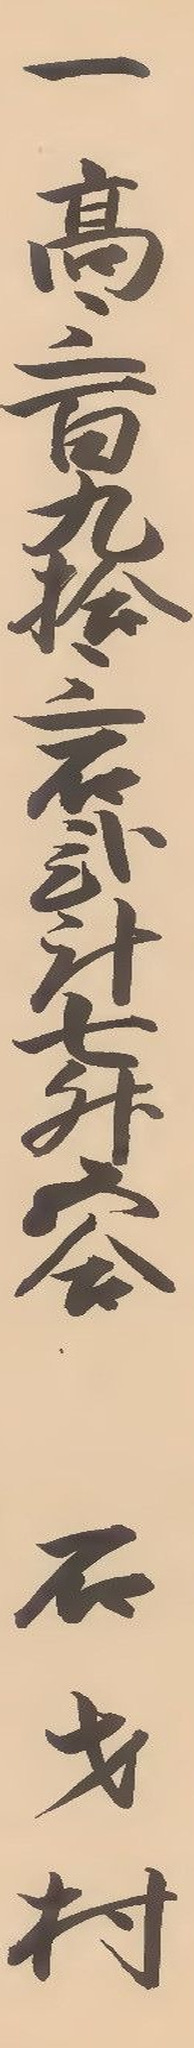一高三百九拾三石弐斗七升五合石才村
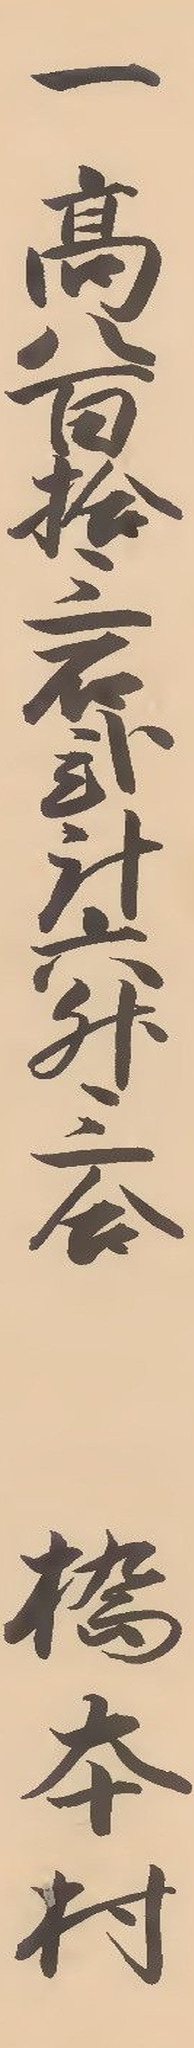一高八百拾三石弐斗六升三合橋本村
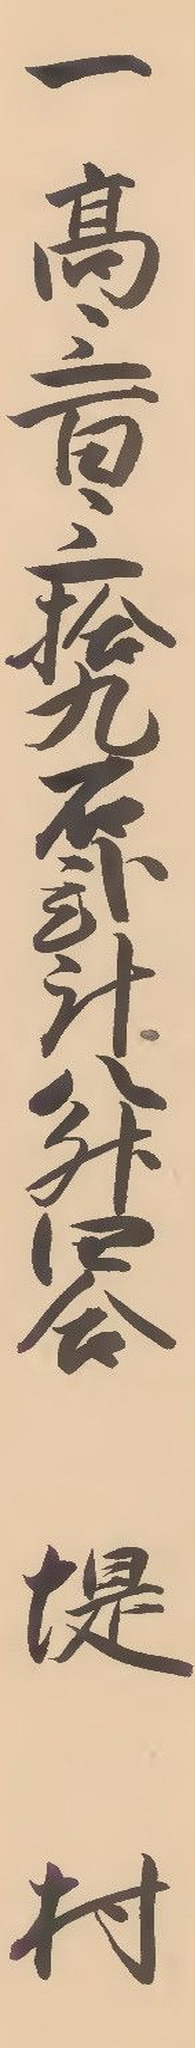一高三百三拾九石弐斗八升四合堤村

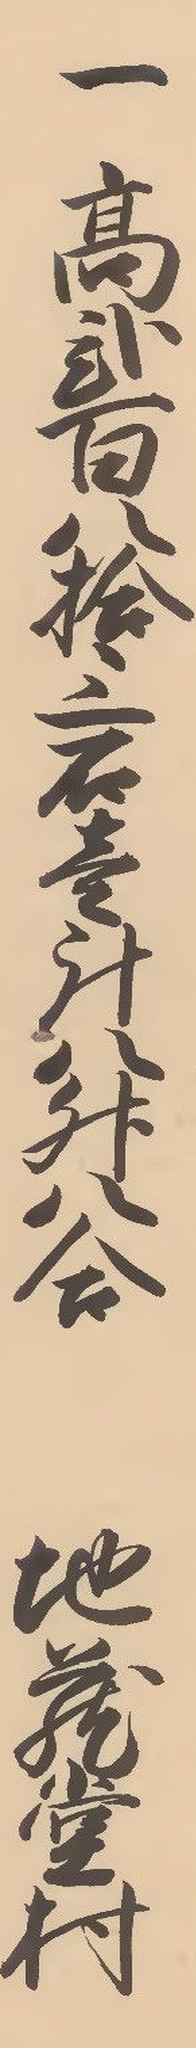一高弐百八拾三石壱斗八升八合地蔵堂村
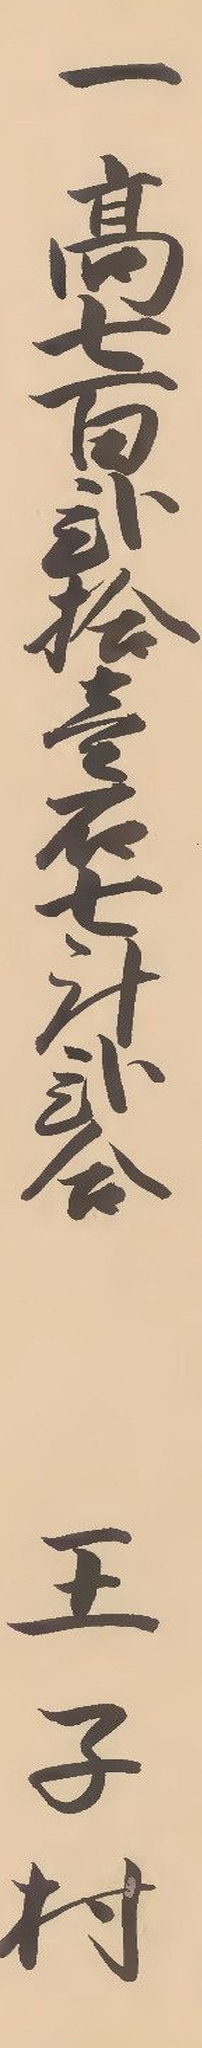一高七百弐拾壱石七斗弐合王子村
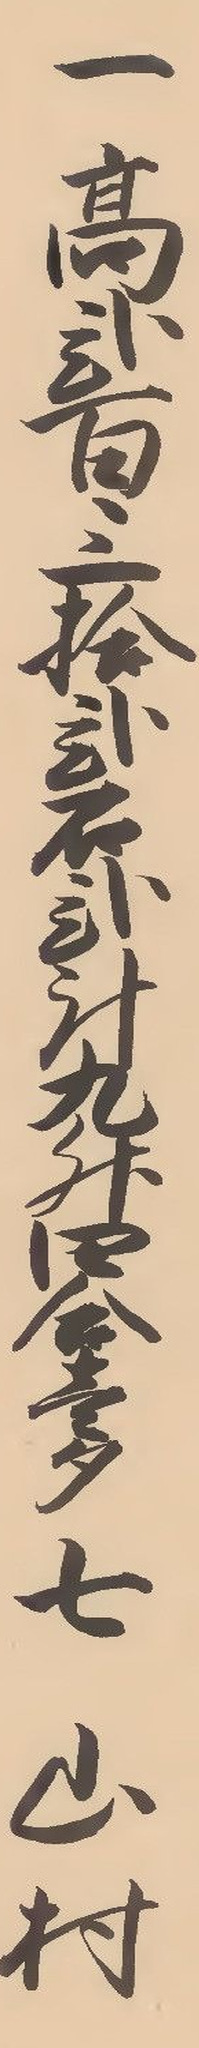一高弐百三拾弐石弐斗九升四合壱勺七山村
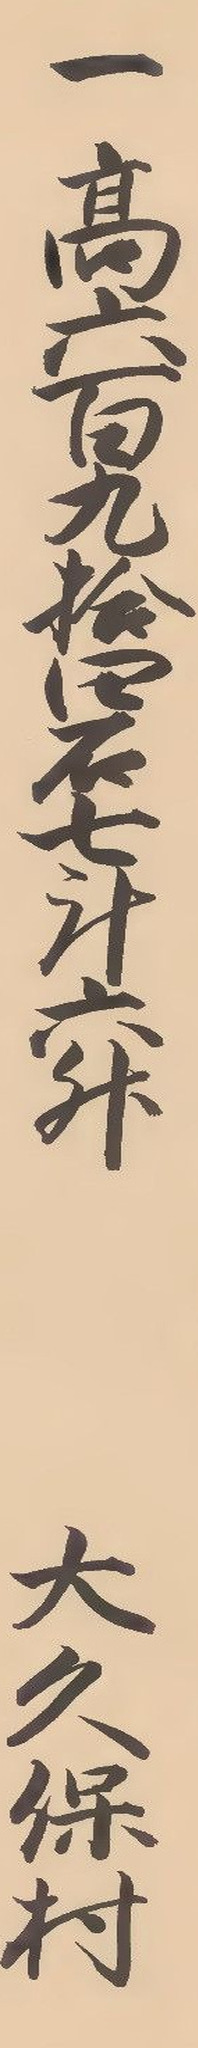一高六百九拾四石七斗六升大久保村
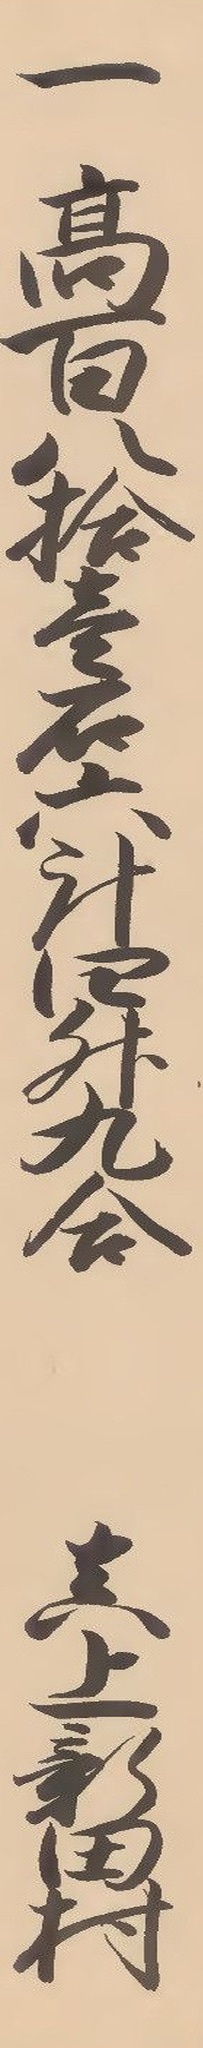一高百八拾壱石六斗四升九合真上新田村
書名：和泉国郷帳
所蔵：国立公文書館 National Archives of Japan
